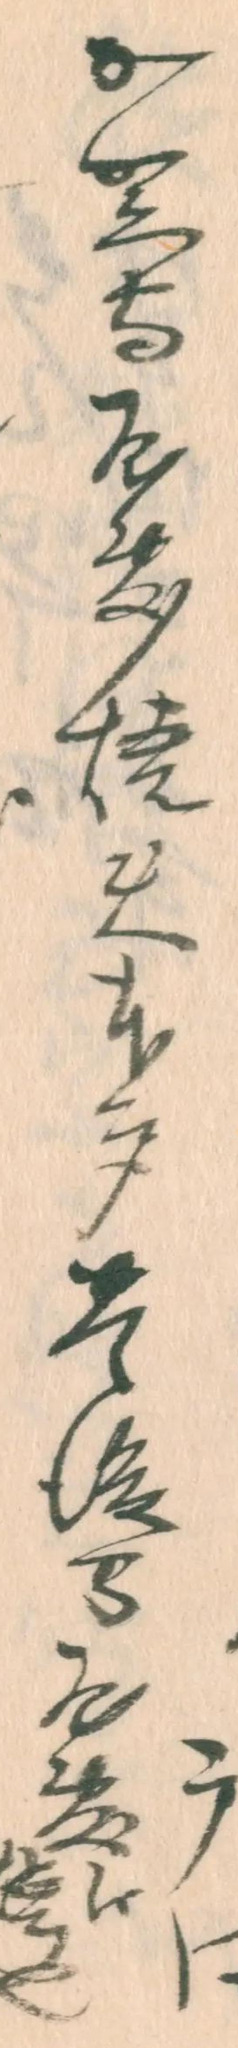加賀守屋敷焼失本多豊後守屋敷え焼込
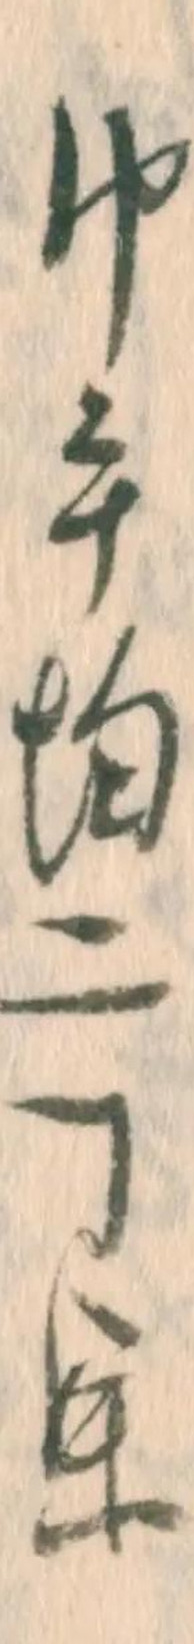幅平均二丁余
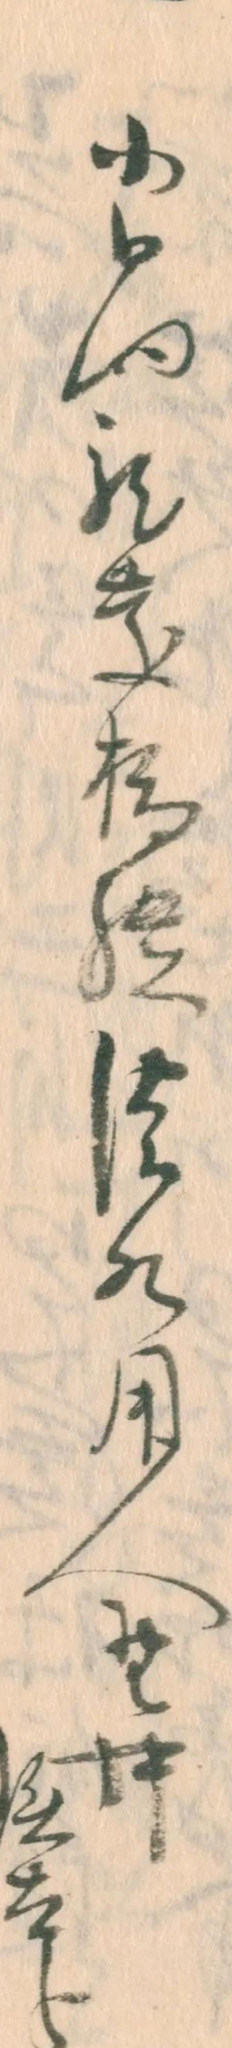一小日向龍慶橋続清水用人野中鉄太郎
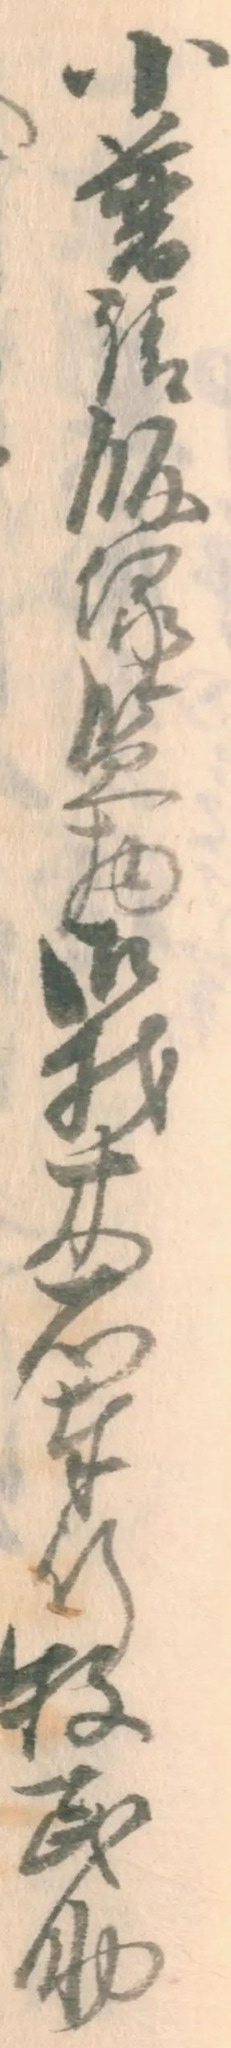小普請飯塚監物御材木石奉行牧民助
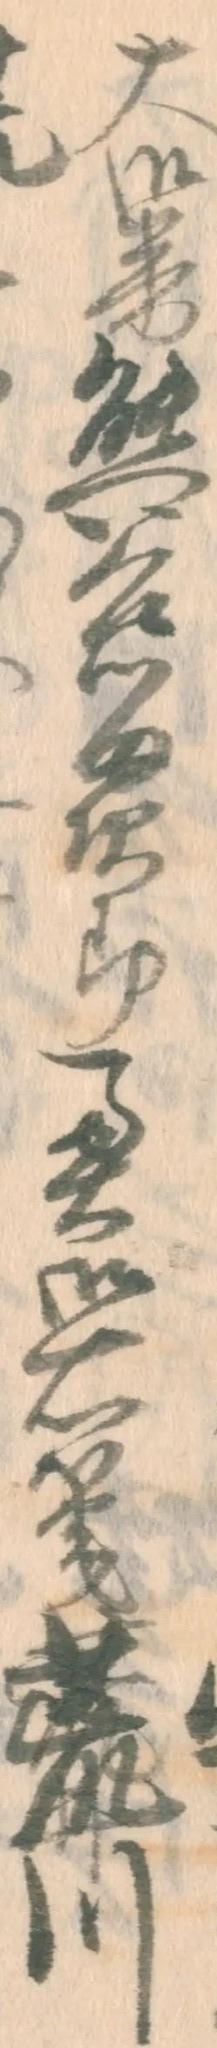大御番熊谷留次郎奥御右筆荒川
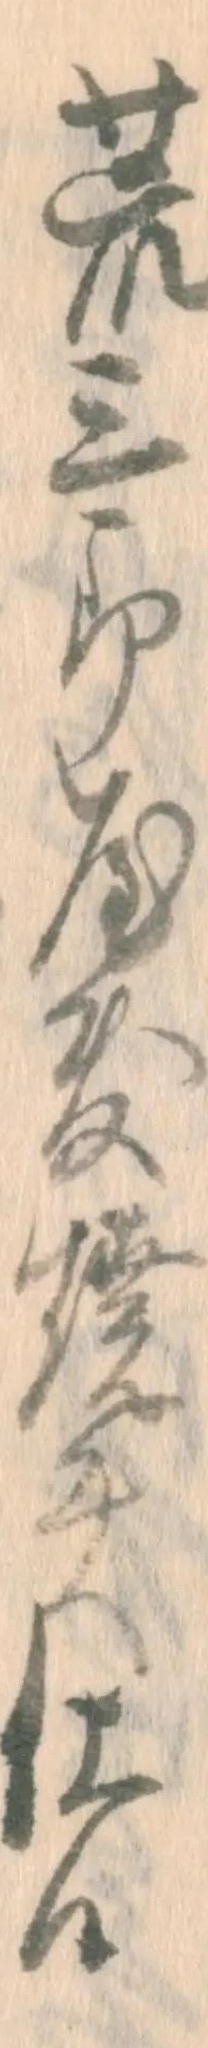荒三郎屋敷焼失仕候
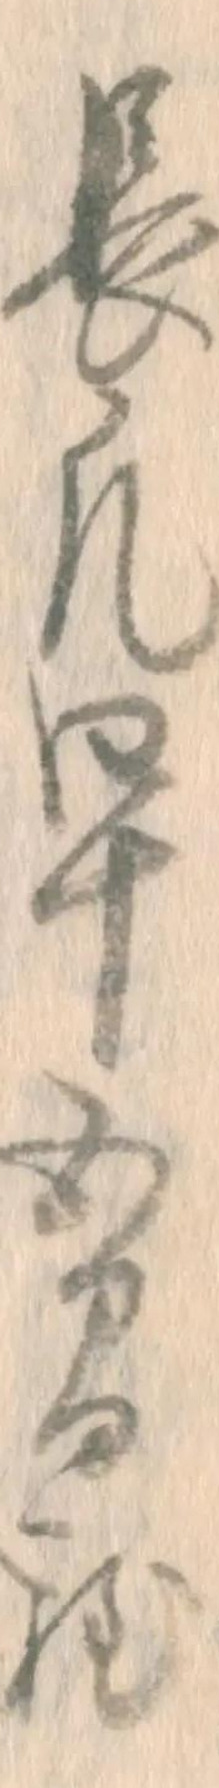長凡四十五間程
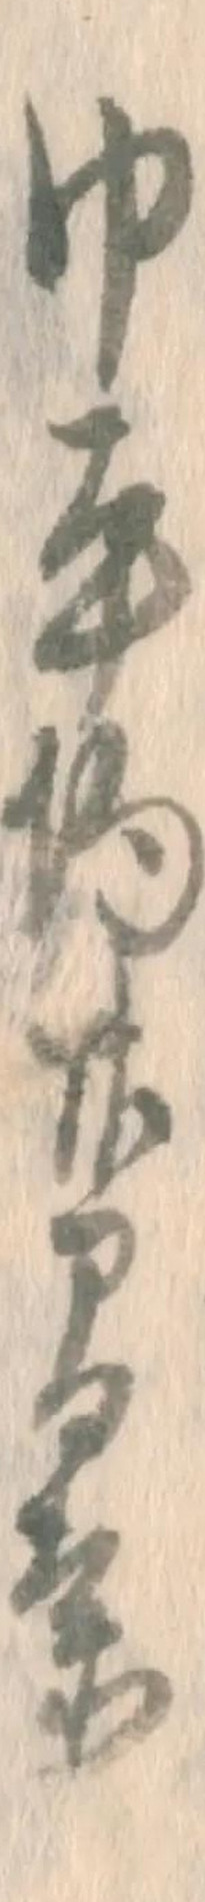幅平均廿間余
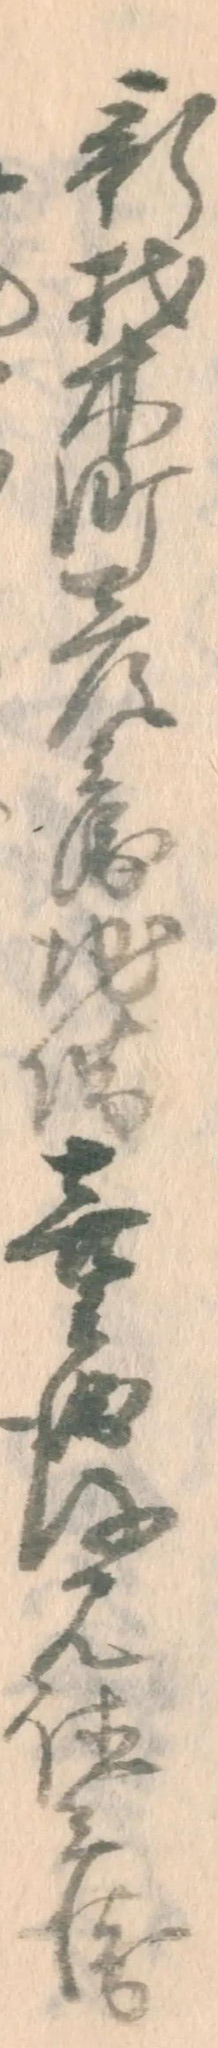一新材木町彦兵衛地借喜兵衛後見徳兵衛
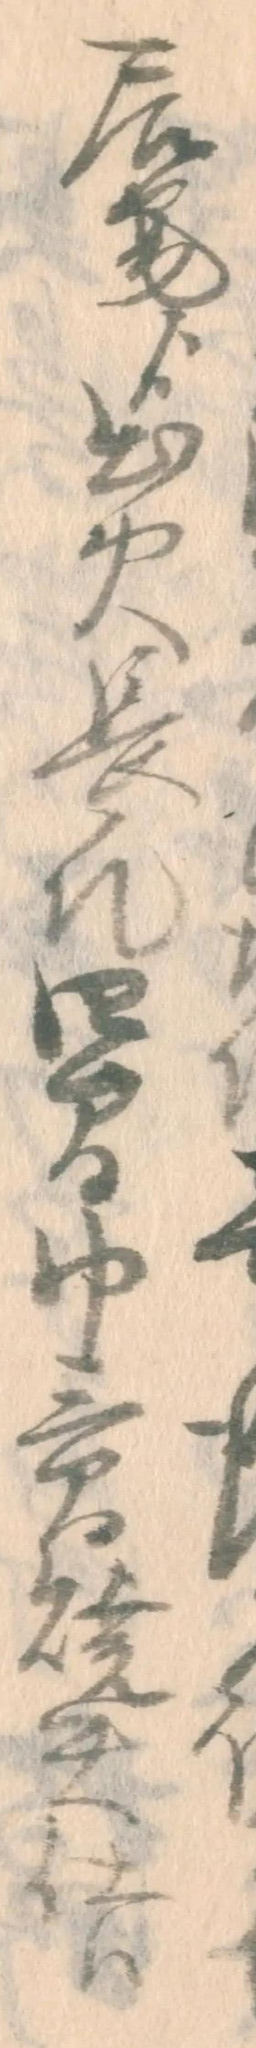居宅ゟ出火長凡四間幅三間焼失仕候
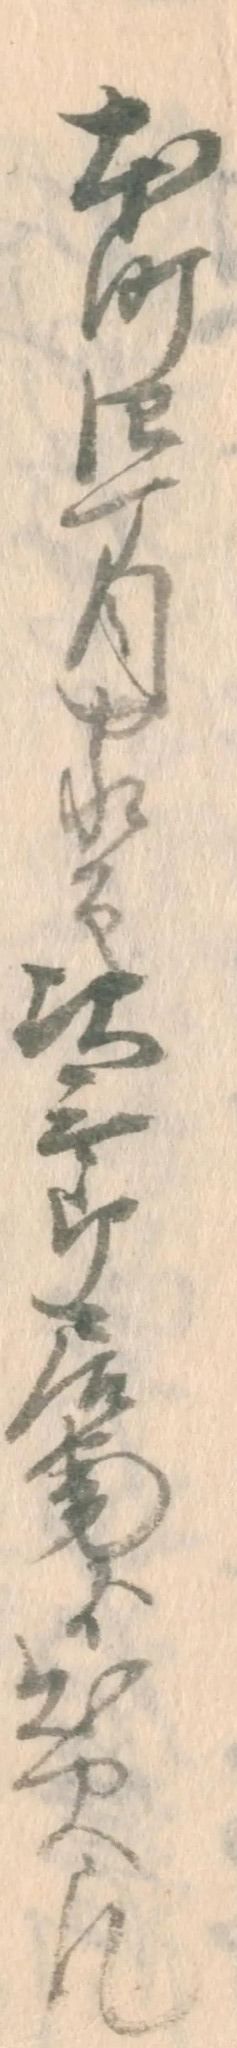一本町四丁目家主次三郎居宅ゟ出火凡
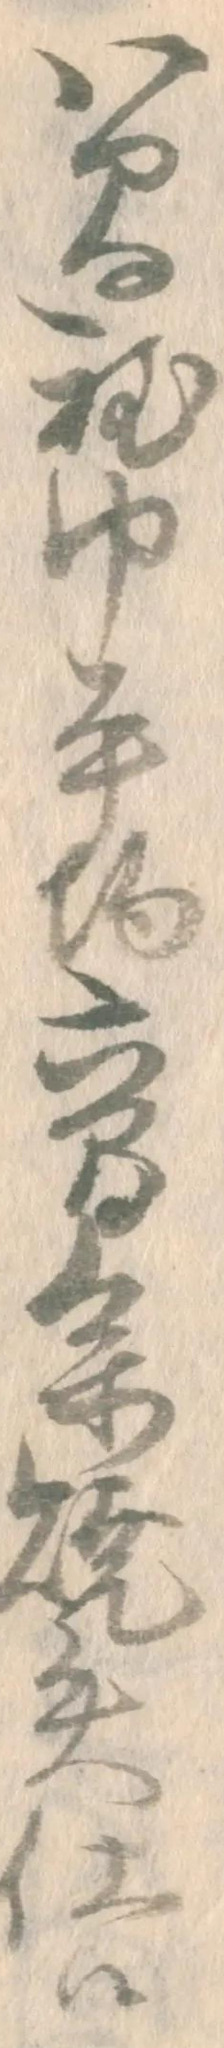八間程幅平均六間余焼失仕候

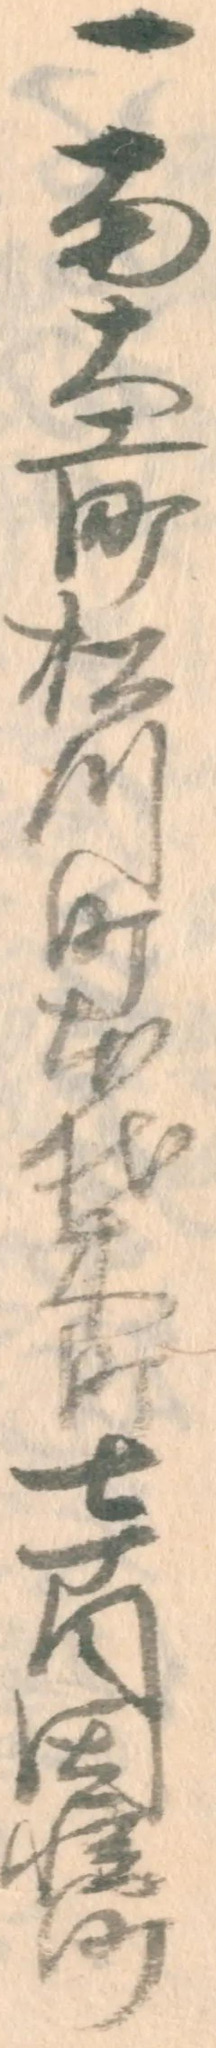一南大工町松川町本材木町七丁目因幡町
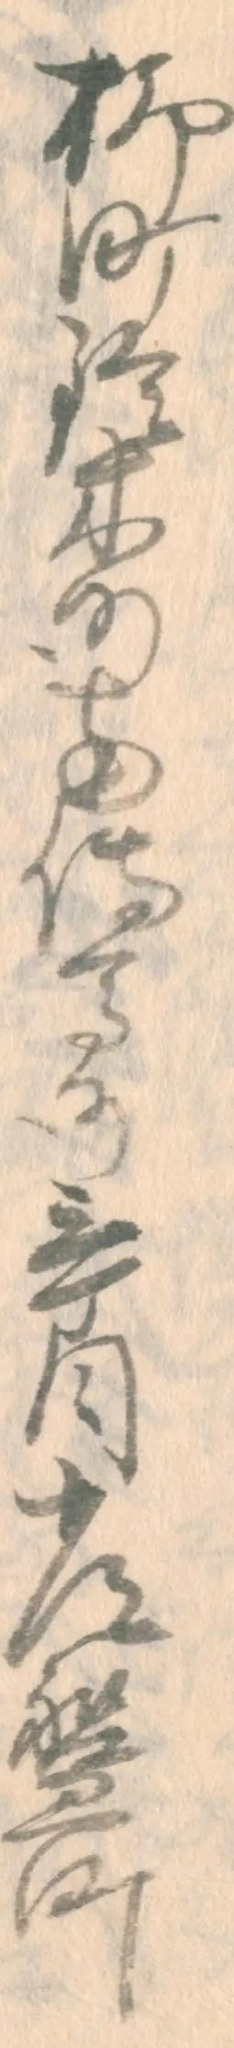柳町鈴木町南伝馬三丁目常磐町
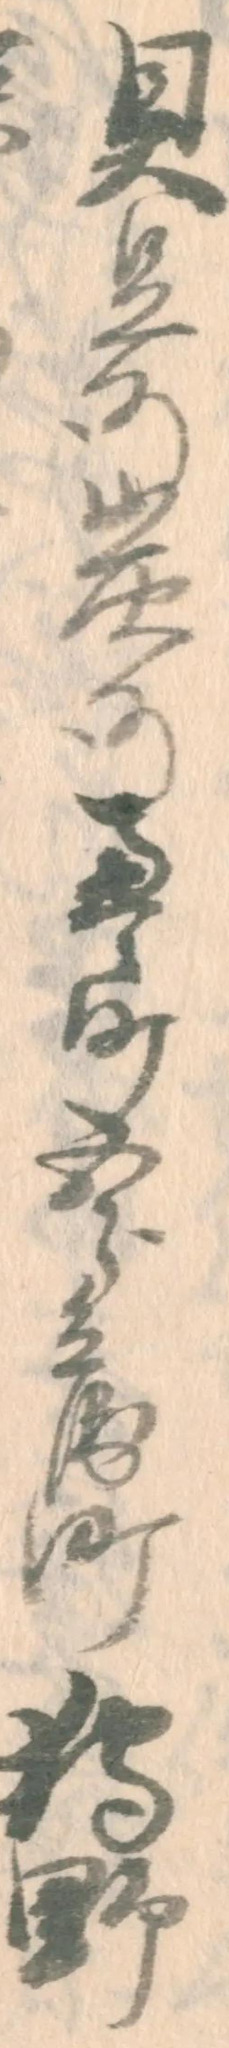具足町炭町畳町五郎兵衛町狩野
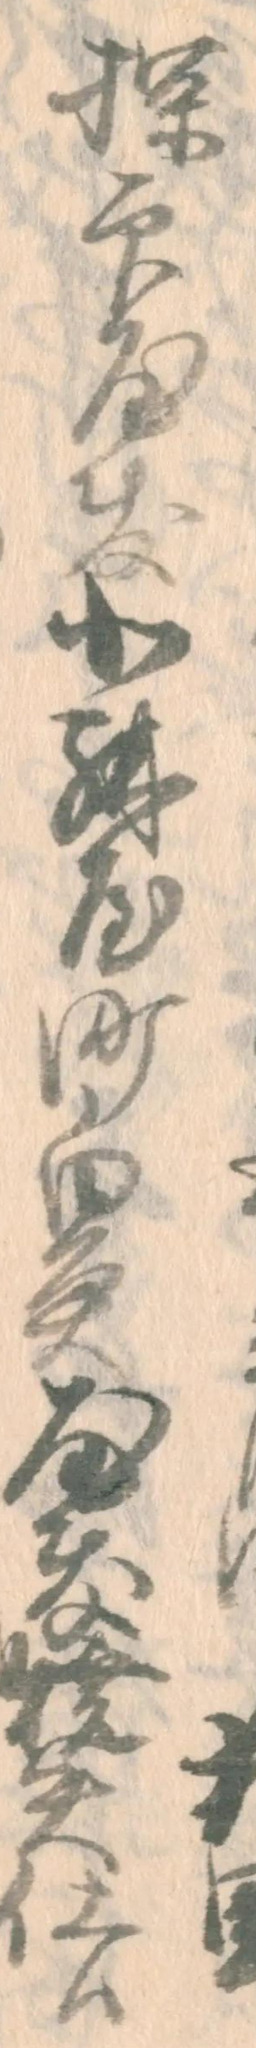探印屋敷北紺屋町白魚屋敷焼失仕候
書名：地震災書留 2巻. [1] 内表紙に「地震災書留　安政二卯年　但本所深川御用屋敷地代免除調」とあり
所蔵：国立国会図書館 National Diet Library, JAPAN
